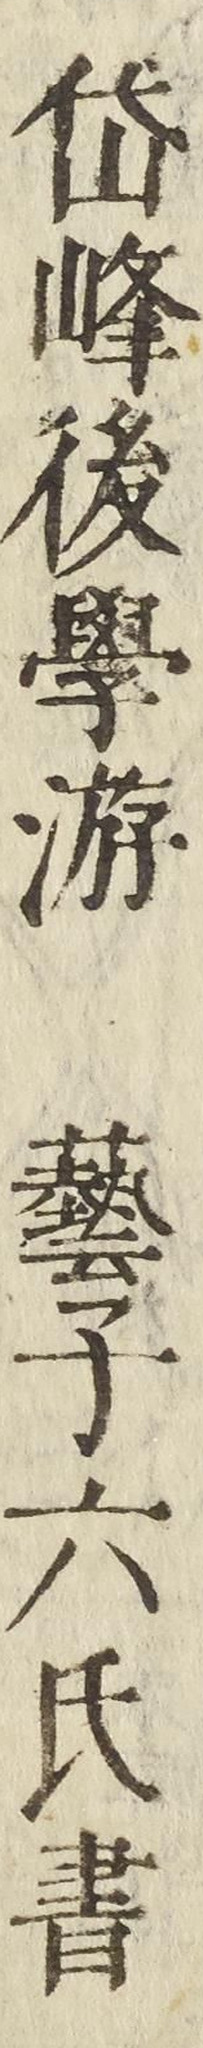岱峰後学游芸子六氏書
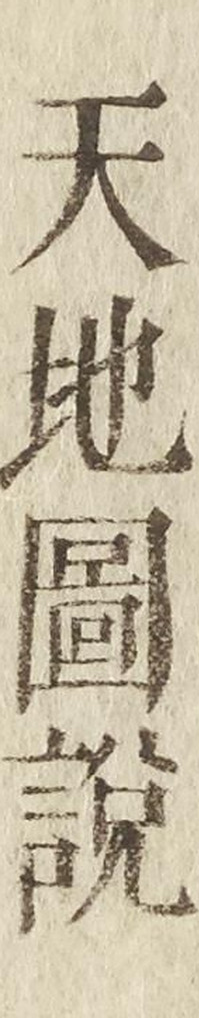天地図説
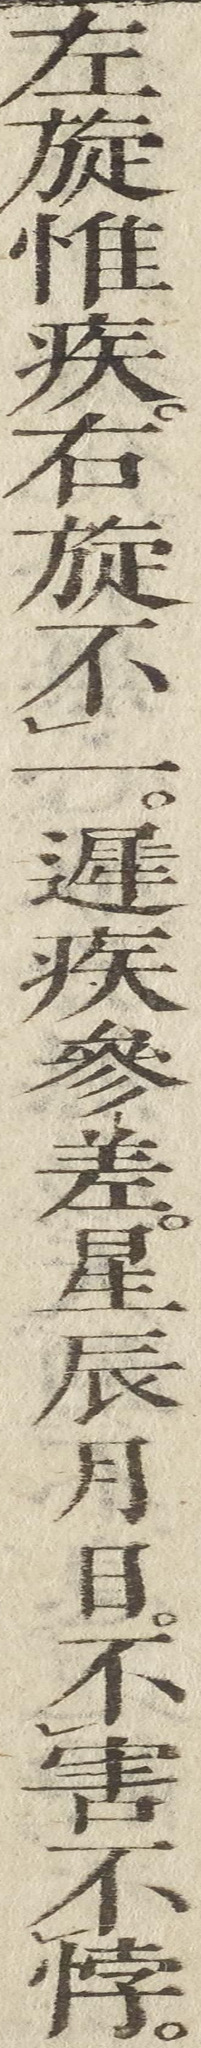左旋惟疾。右旋不一。遅疾参ー差。星辰月日。不害不悖。

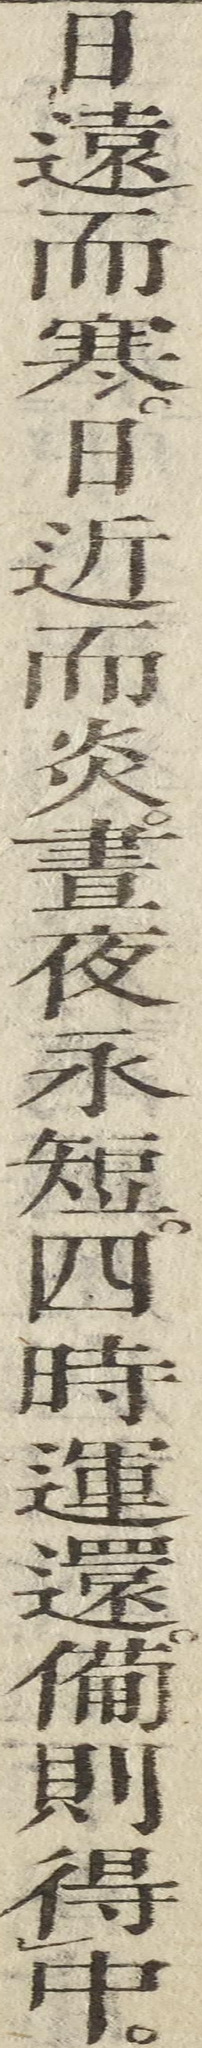日遠而寒。日近而炎。昼夜永短。四時運還。僃則得中。
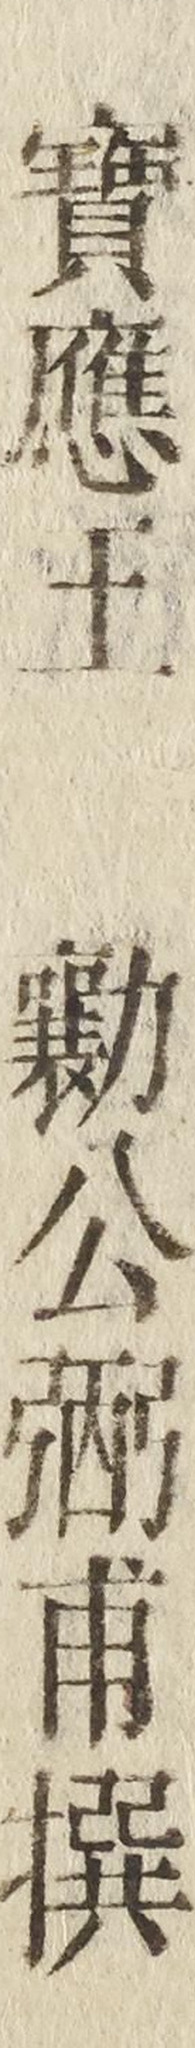宝応王勷公弼甫撰
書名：天經或問　序圖
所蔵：東京大学地震研究所図書室 Earthquake Research Institute Library, The University of Tokyo, JAPAN
